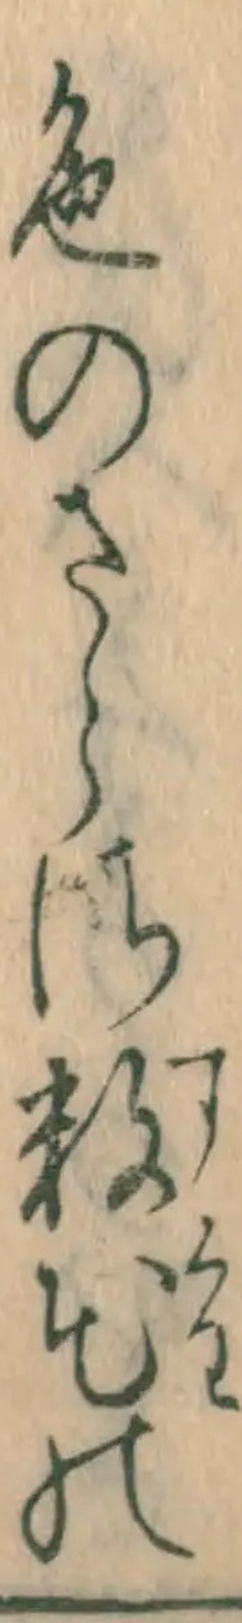色のさらさ数花の
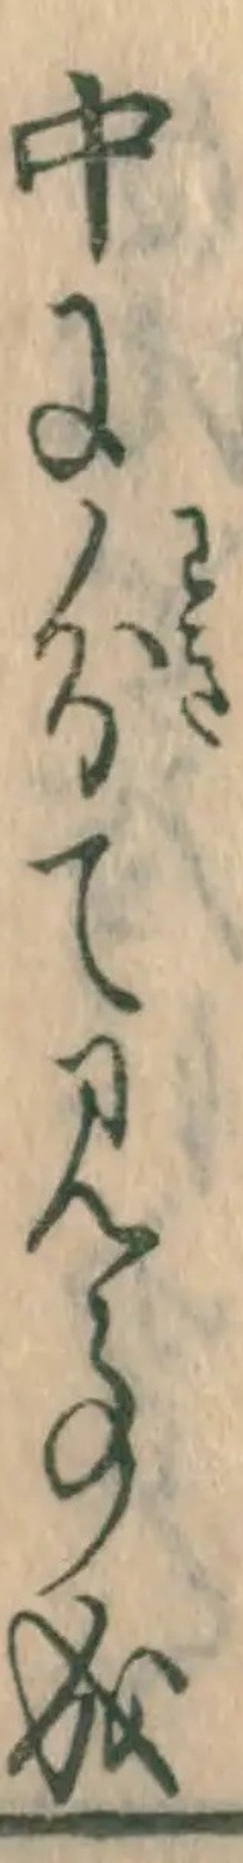中に分て見事成
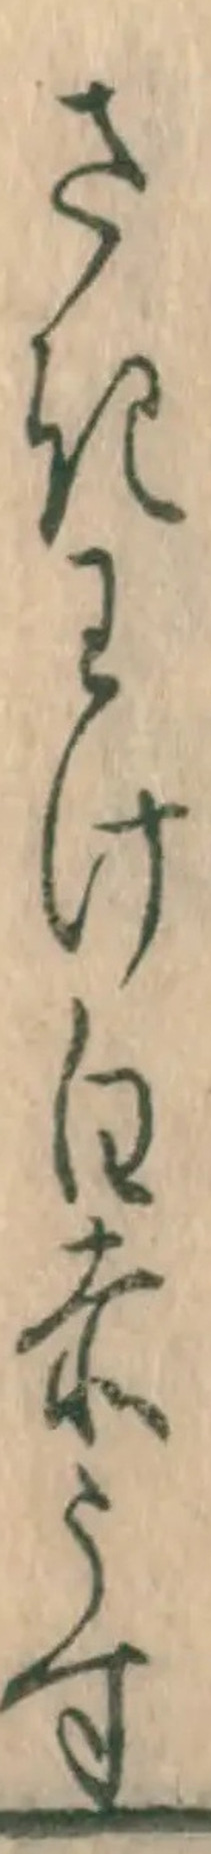さきわけ白赤うす
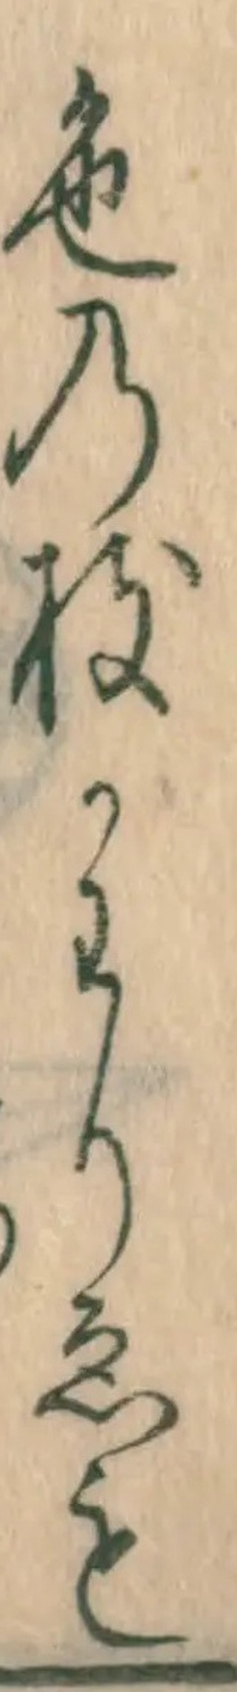色の枝かわりゑも
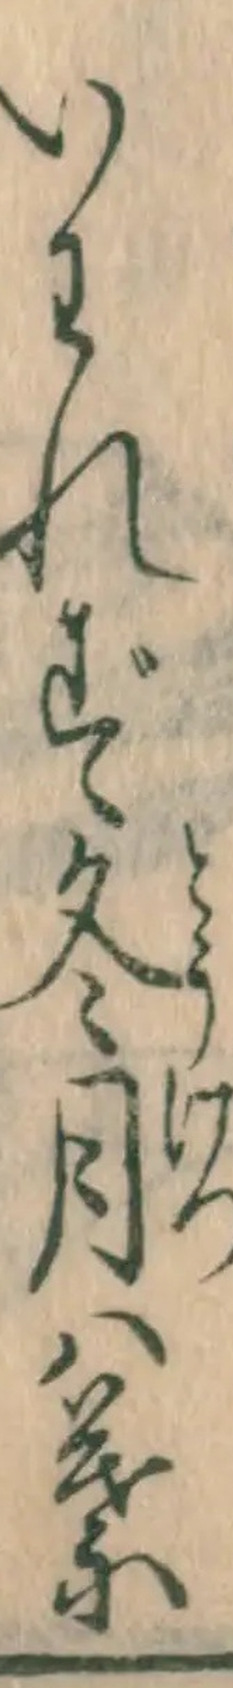いわれず冬月は葉
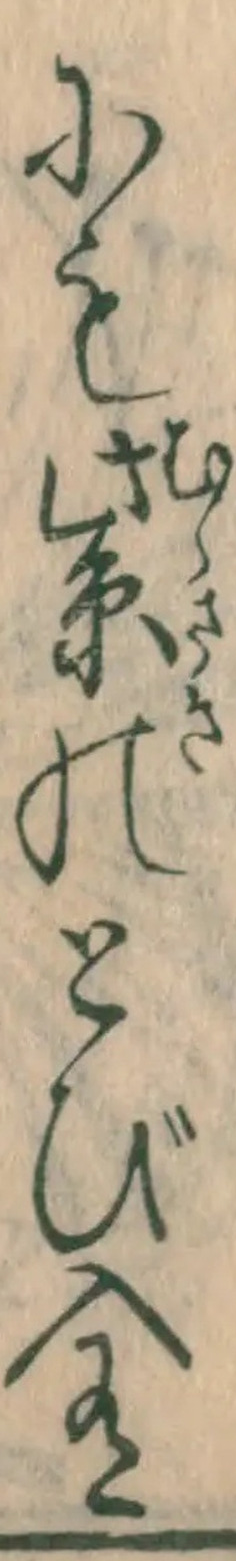にも紫のとび入有
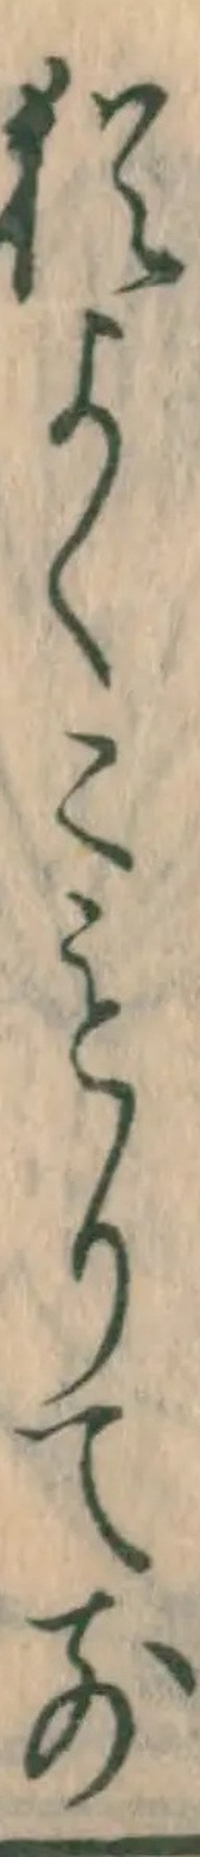猶よくこもりて前
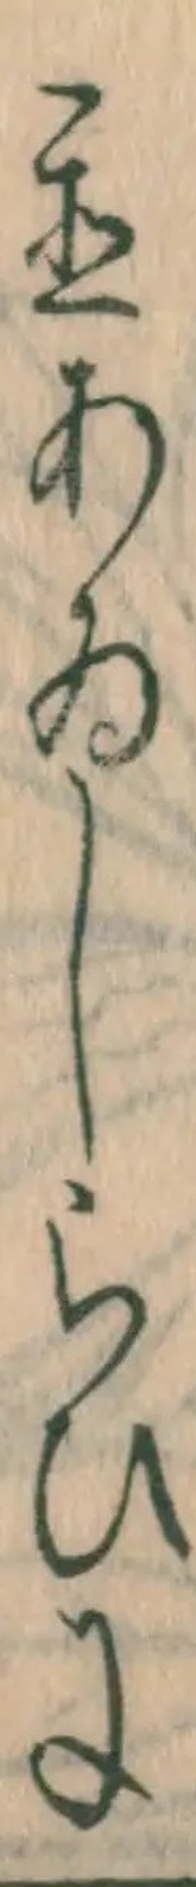置あゐしらひに
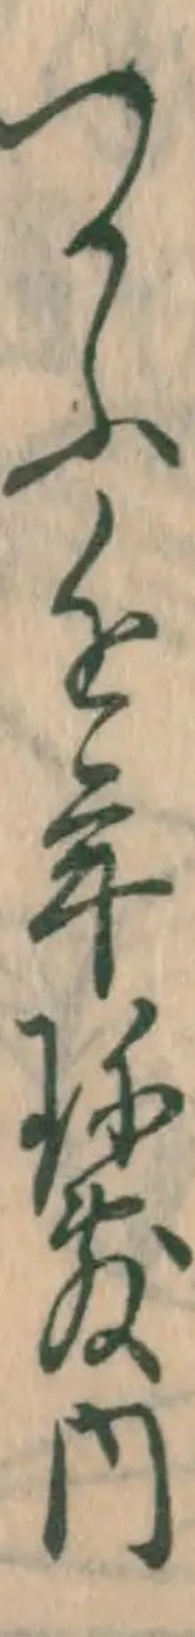つかふ近年珍敷内
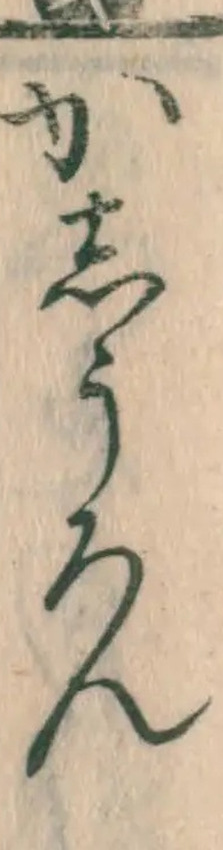かしうろん
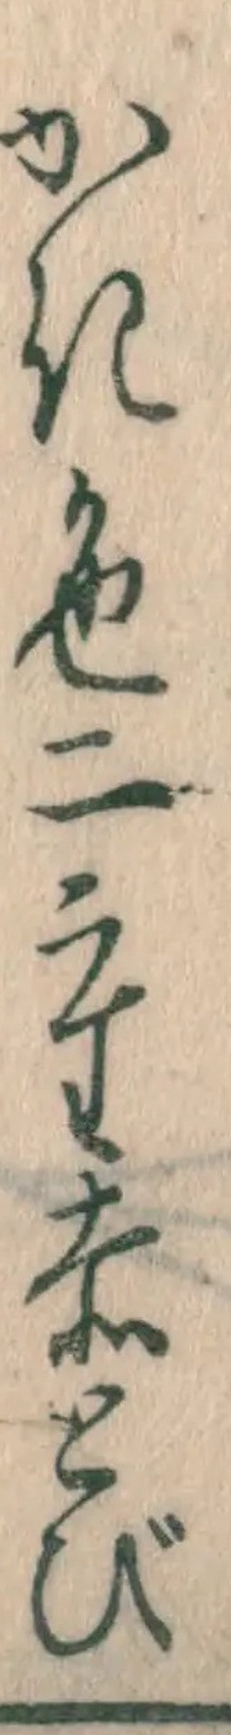かき色二重赤とび
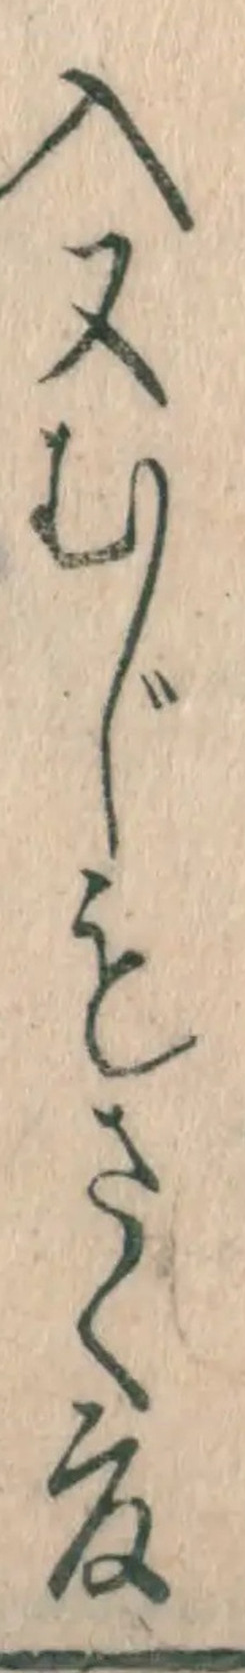入又むじもさく夏
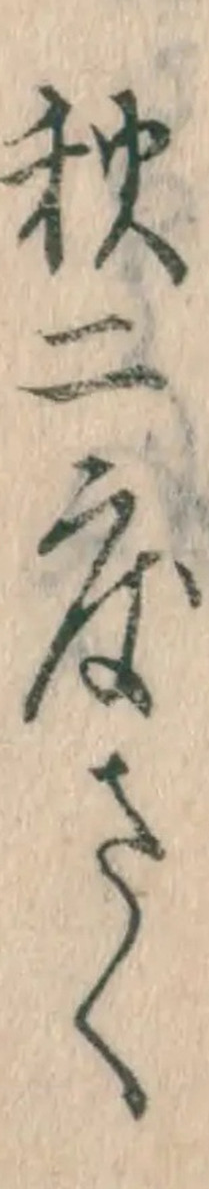秋二度さく

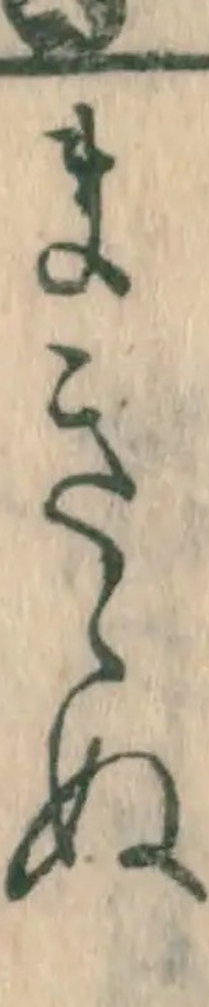まきゝぬ
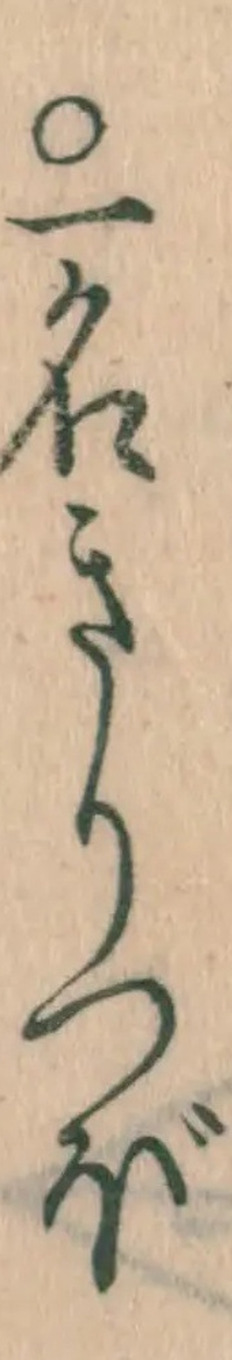○一名きりつぼ
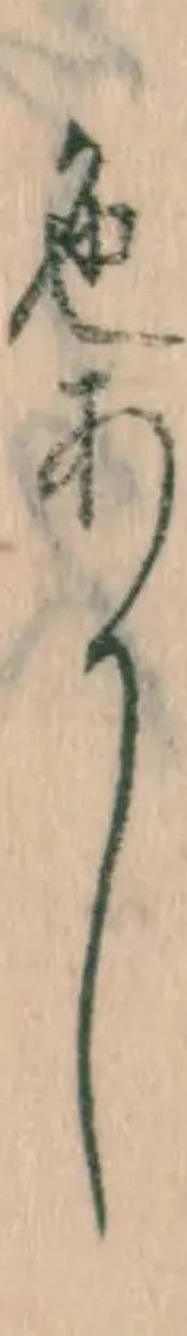色あかし
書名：錦繍枕 5巻. [5]
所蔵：国立国会図書館 National Diet Library, JAPAN
